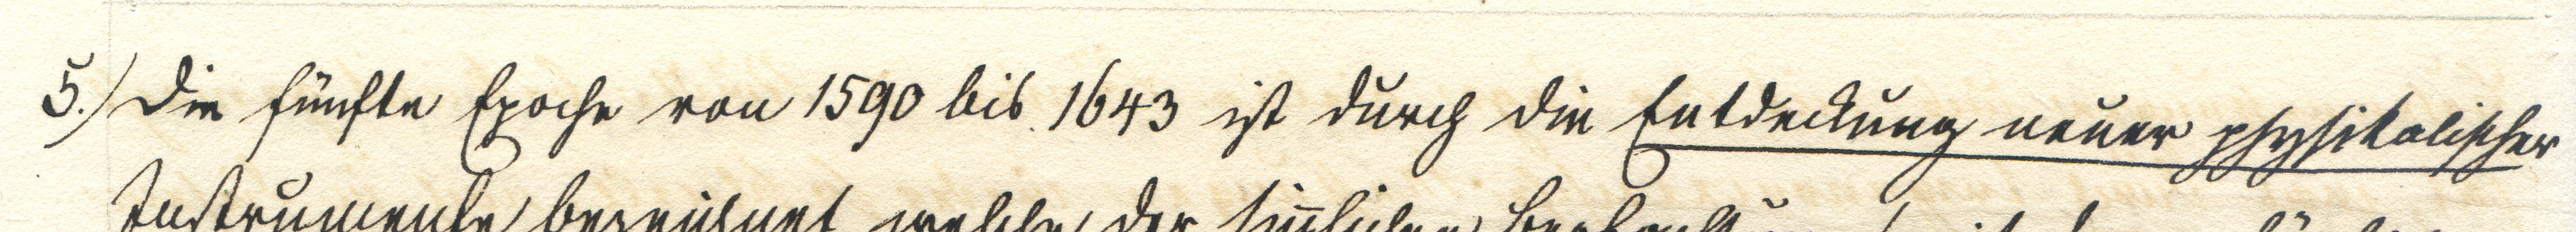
Die fünfte Epoche von 1590 bis 1643 ist durch die Entdeckungen neuer physikalischer
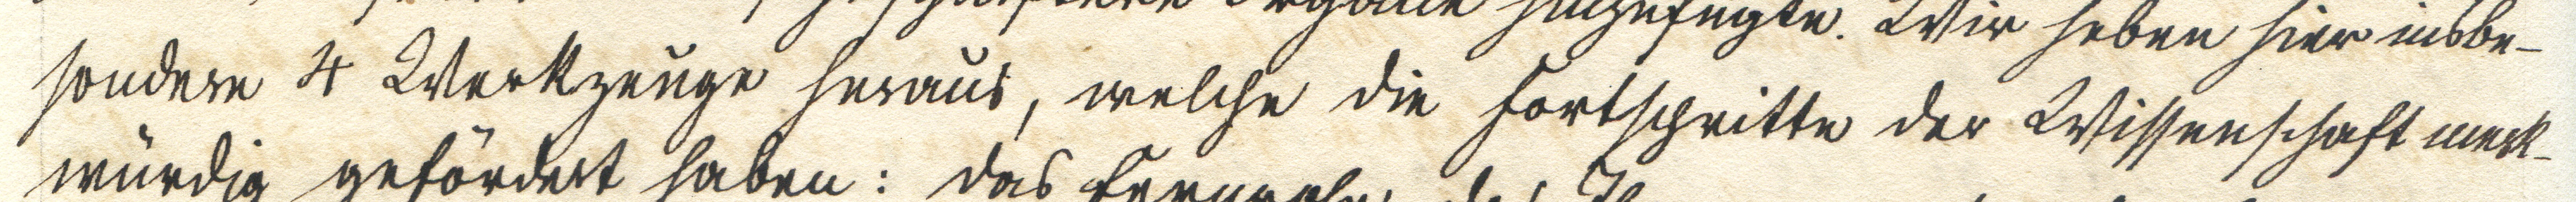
sondere 4 Werkzeuge heraus, welche die Fortschritte der Wissenschaft merk-
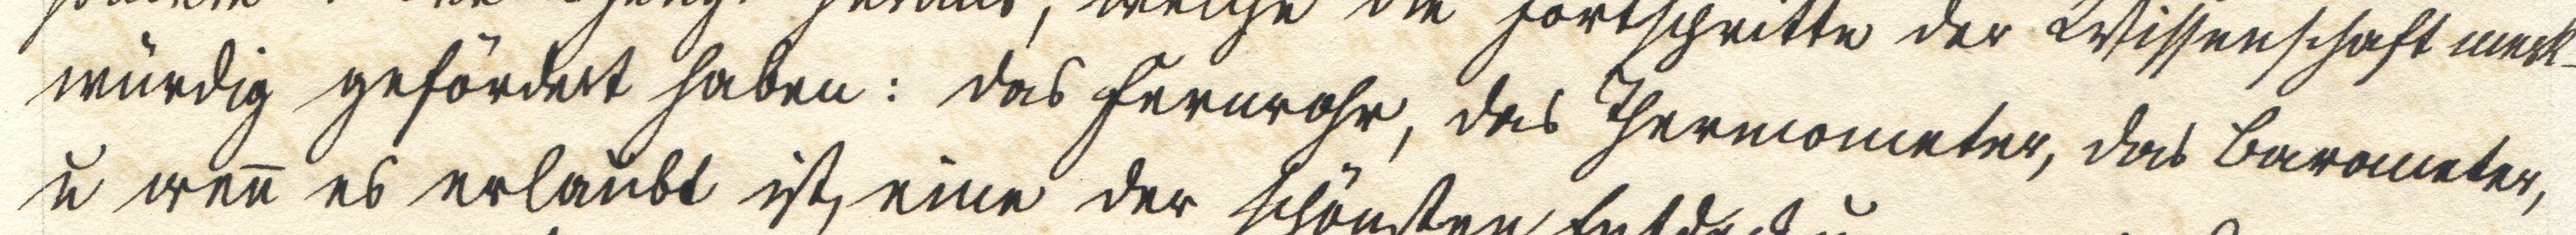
würdig gefördert haben: das Fernrohr, das Thermometer, das Barometer,
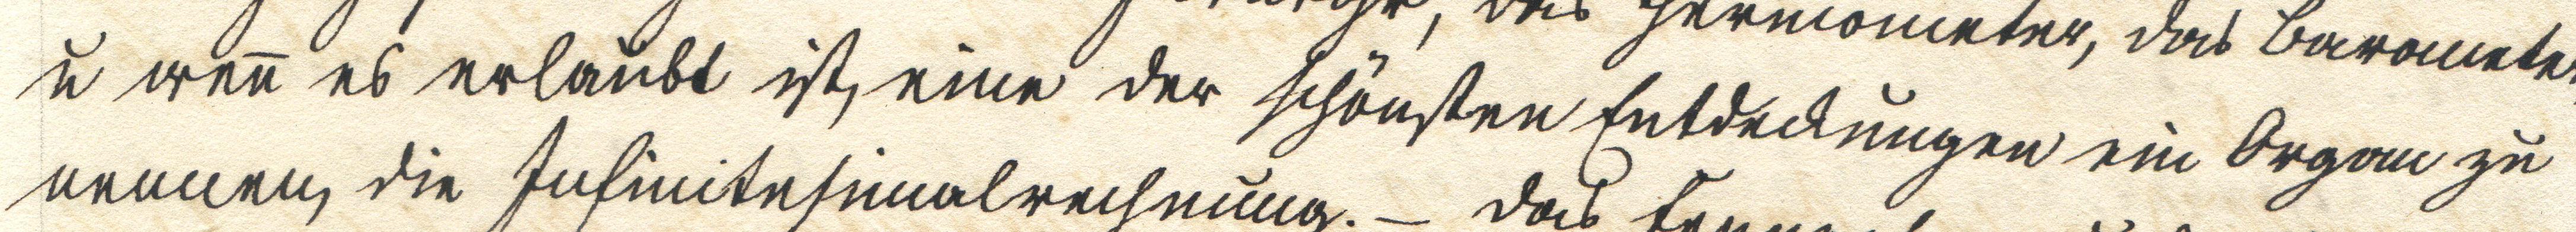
u weñ es erlaubt ist, eine der schönsten Entdeckungen ein Organ zu
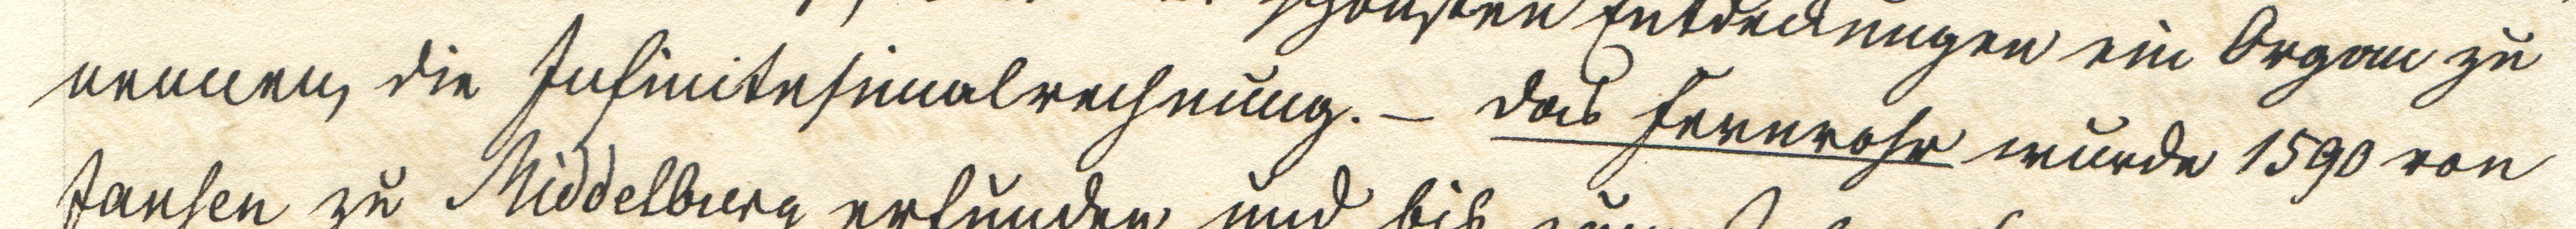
nennen, die Infinitesimalrechnung. – Das Fernrohr wurde 1590 von
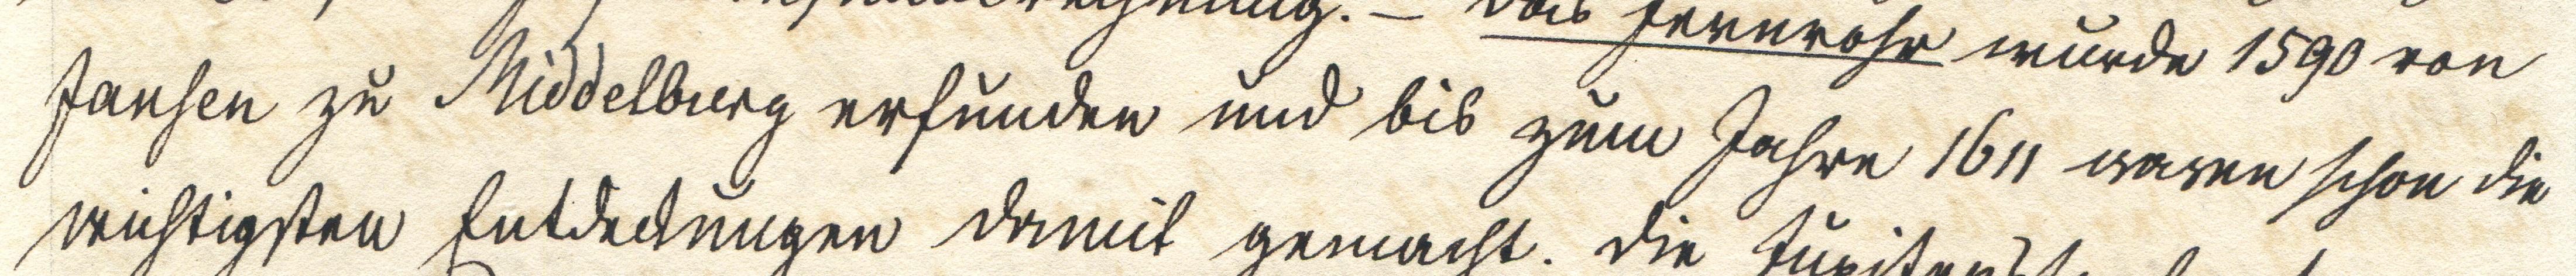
Jansen zu Middelburg erfunden und bis zum Jahre 1611 waren schon die
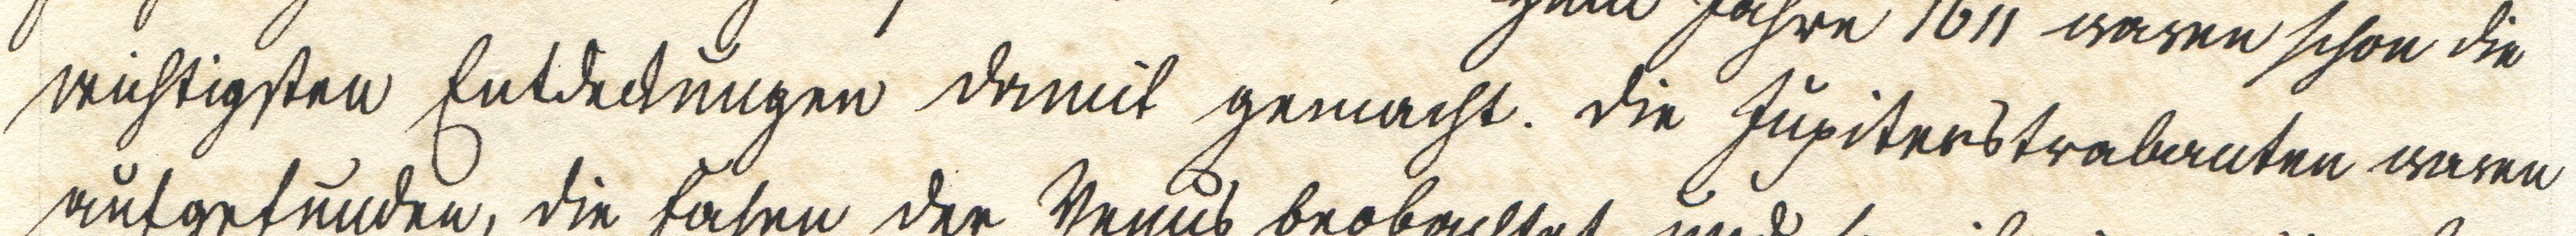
wichtigsten Entdeckungen damit gemacht. Die Jupiterstrabanten waren
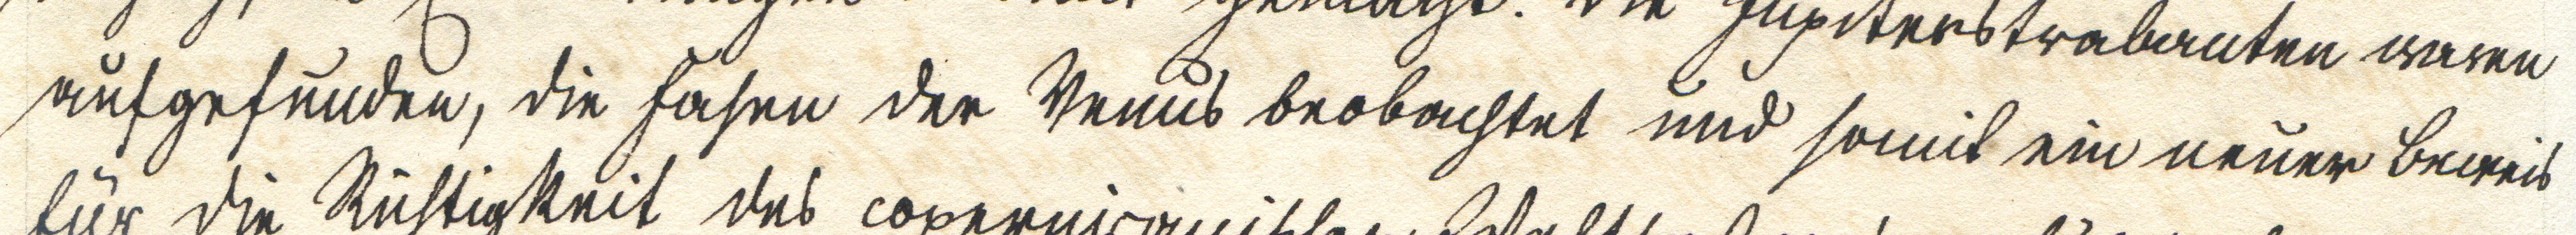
aufgefunden, die Fasen der Venus beobachtet und somit ein neuer Beweis
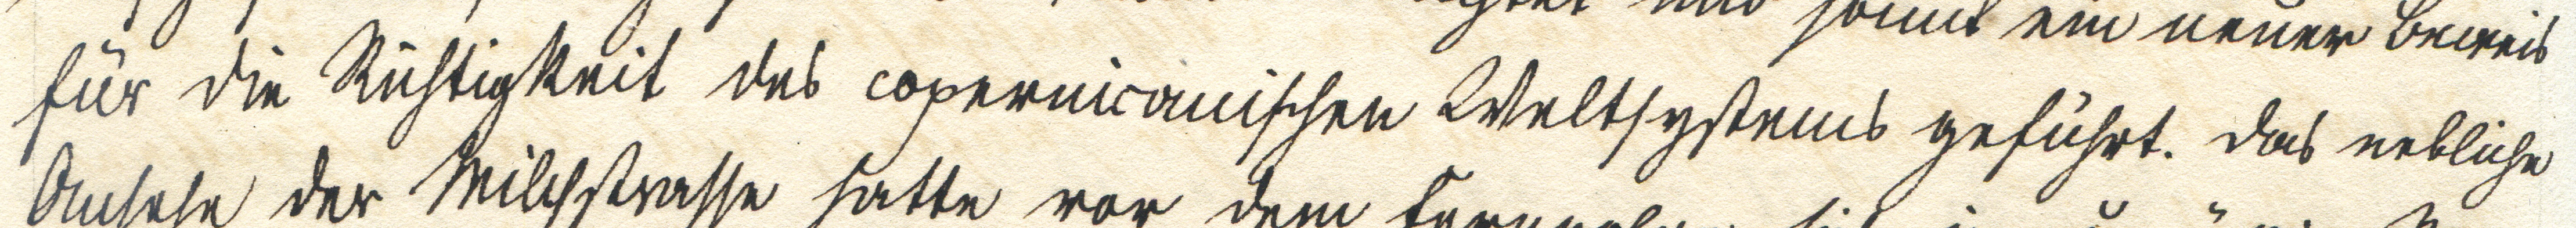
für die Richtigkeit des copernikanischen Weltsystems geführt. Das nebliche
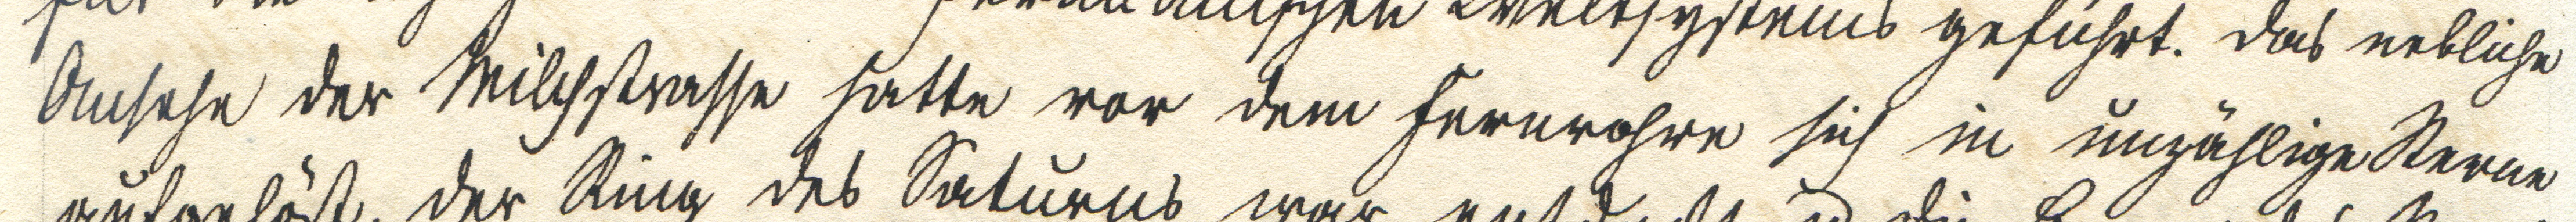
Ansehn der Milchstrasse hatte vor dem Fernrohre sich in unzählige Sterne
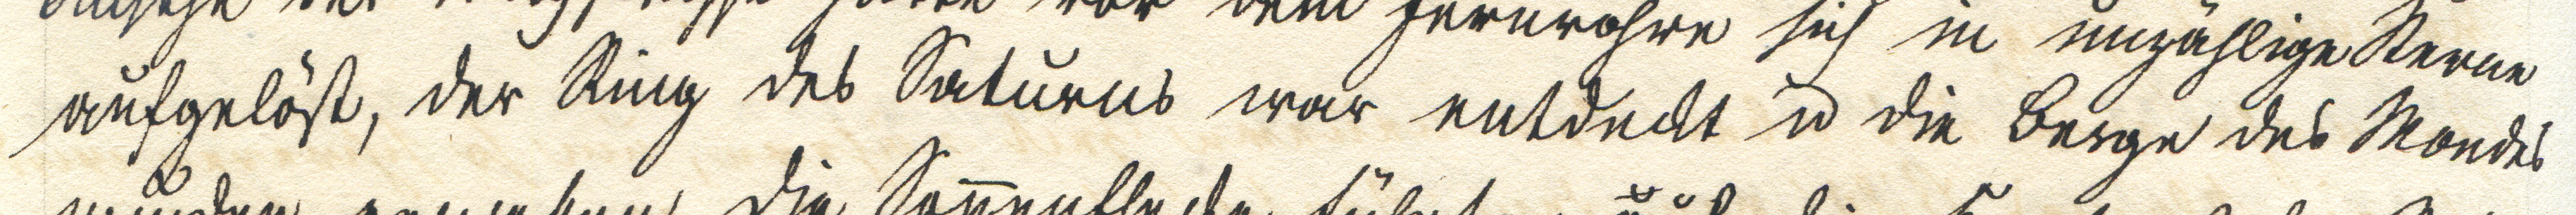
aufgelöst, der Ring des Saturns war entdeckt u die Berge des Mondes
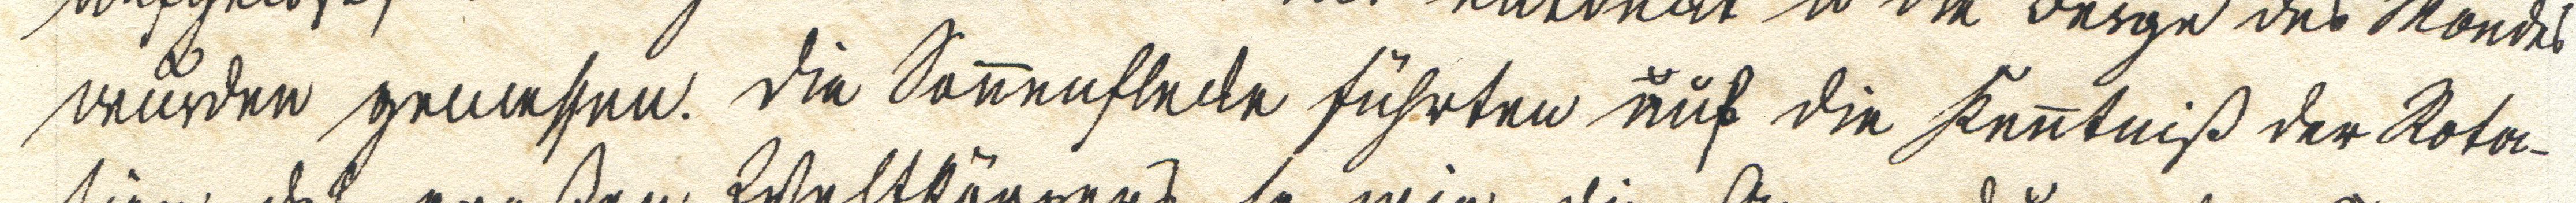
wurden gemessen. Die Soñenflecke führten uauf die Keñtniß der Rota-
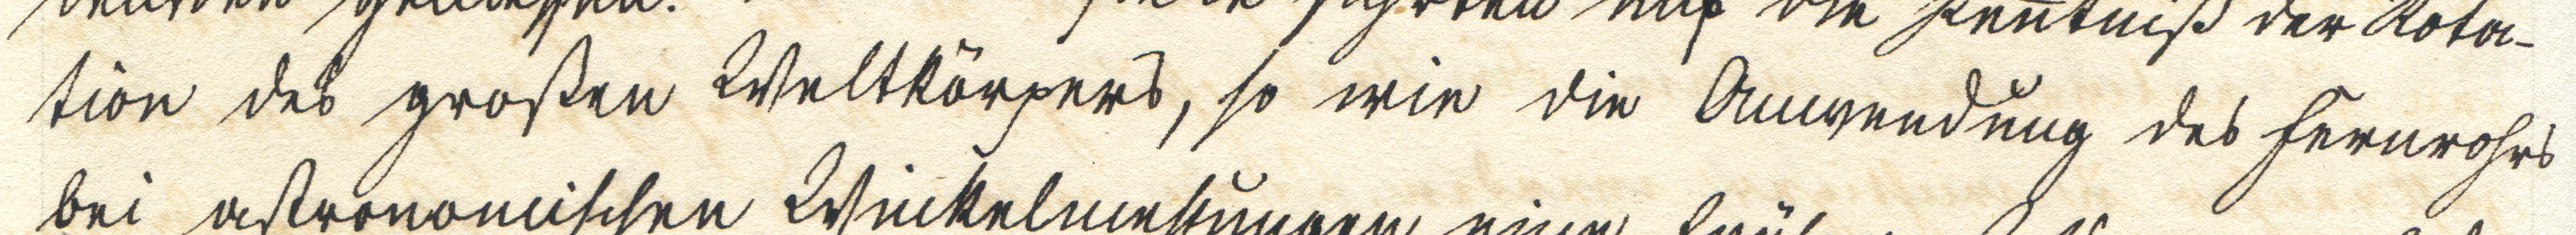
tion des großen Weltkörpers, so wie die Anwendung des Fernrohrs
